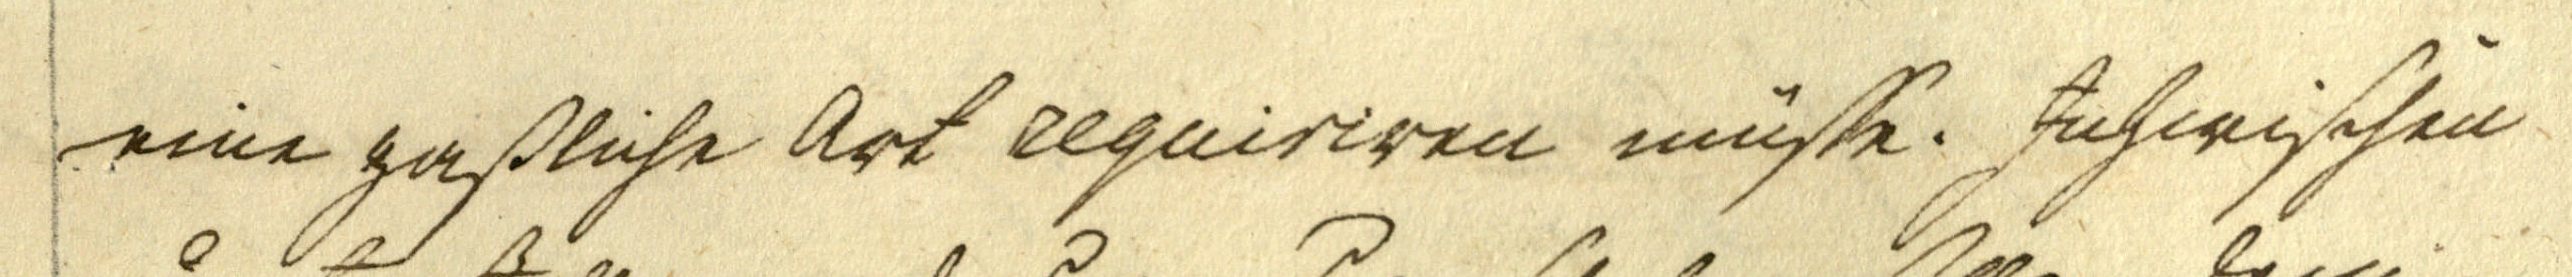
eine paßliche Art requiriren müsse. Inzwischen
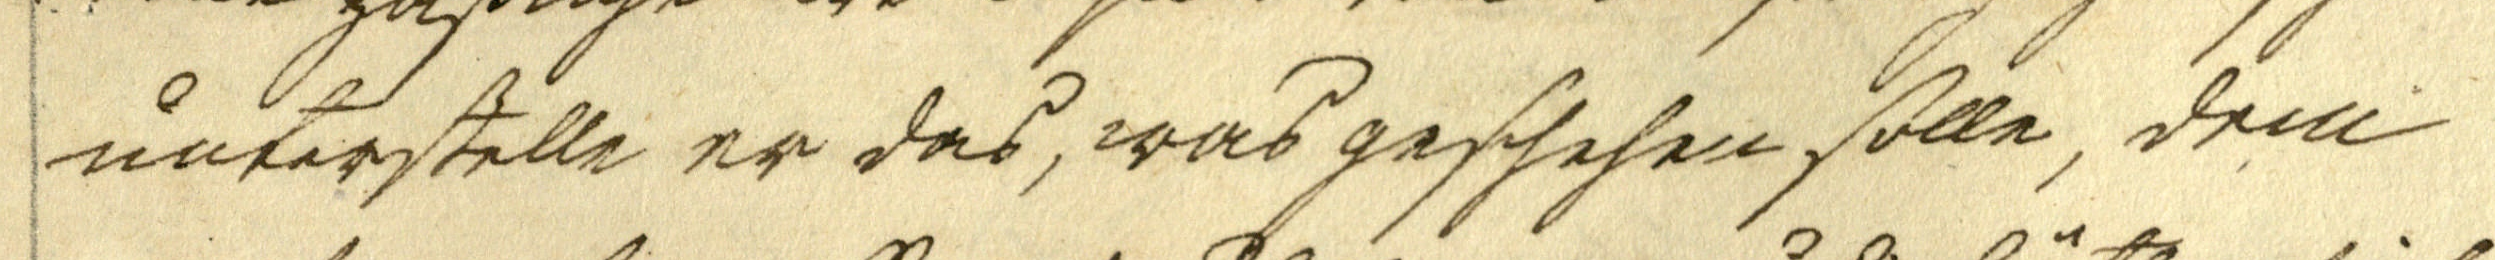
unterstelle er das, was geschehen solle, dem
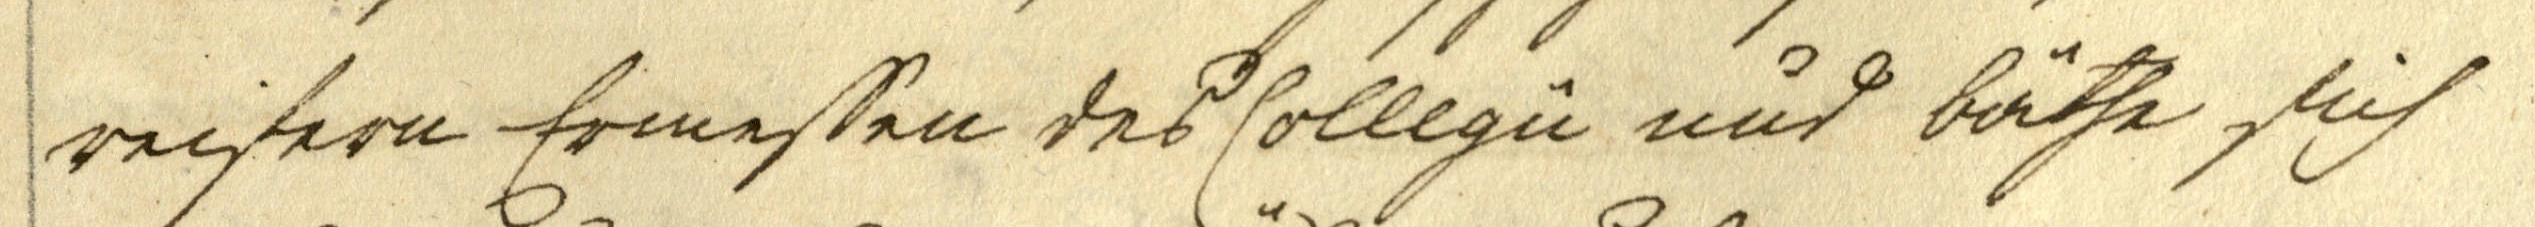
reifern Ermessen des Collegii und bäthe sich
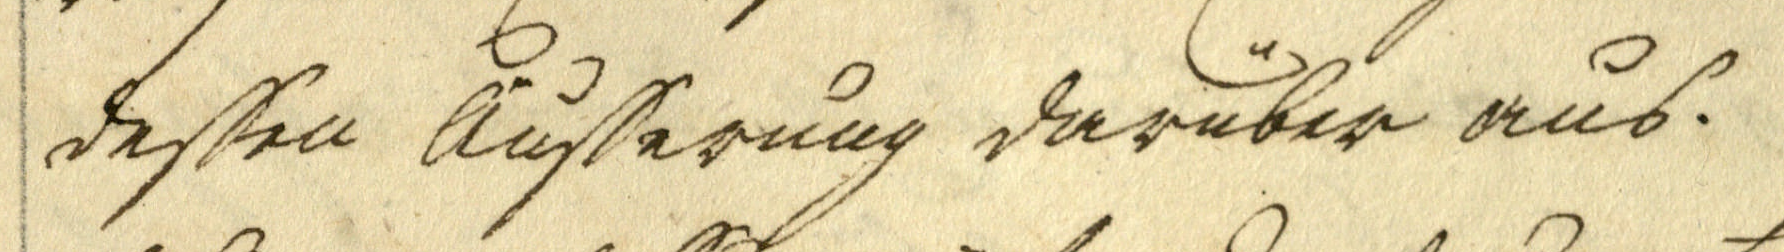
dessen Äusserung darüber aus.
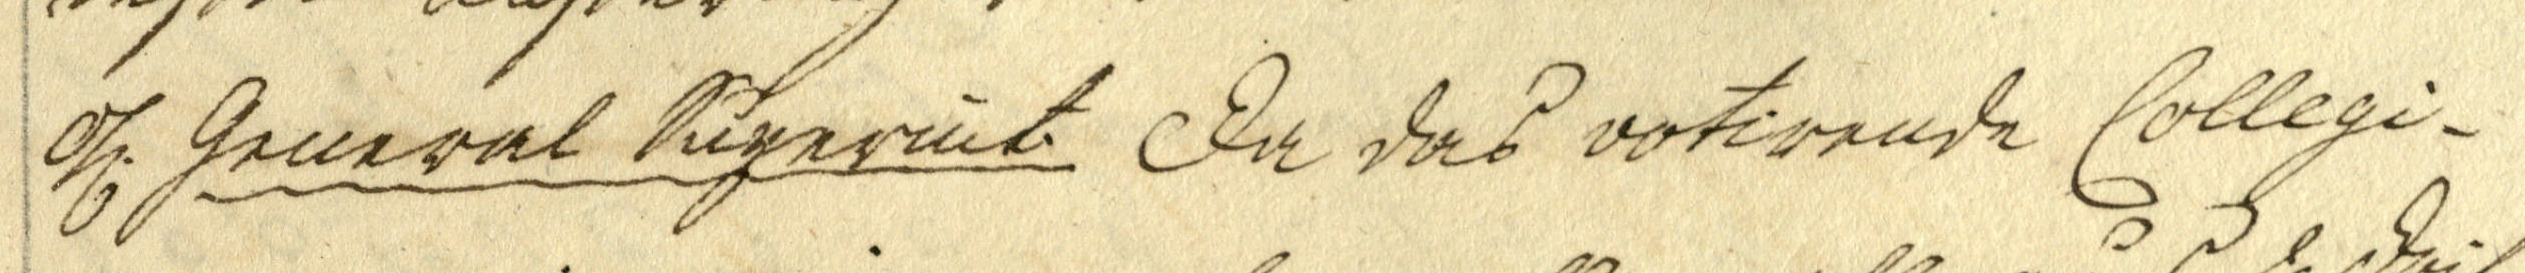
dh. General Superint. Da das votirende Collegi¬
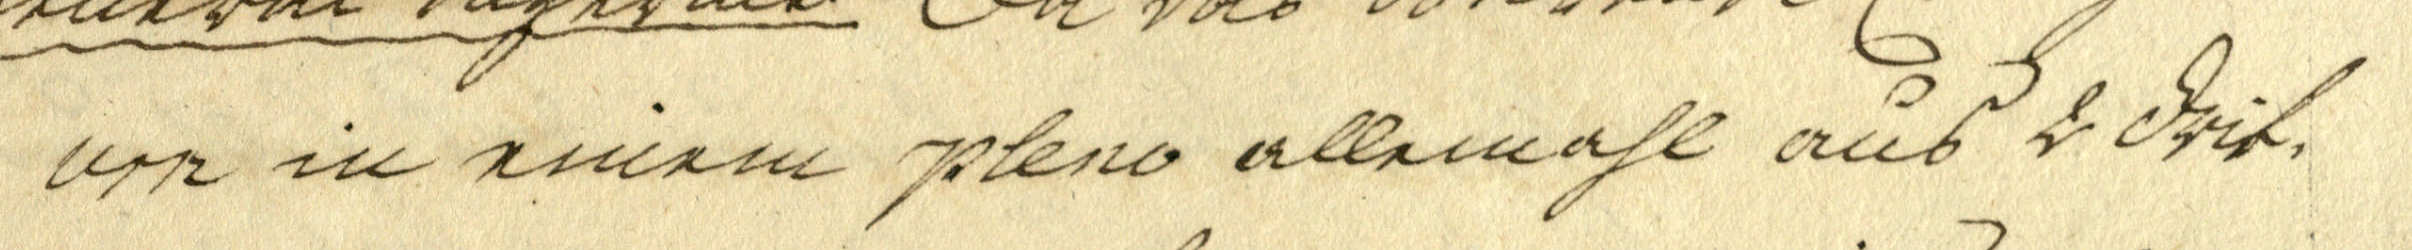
um in einem pleno allemahl aus 2 Drit¬
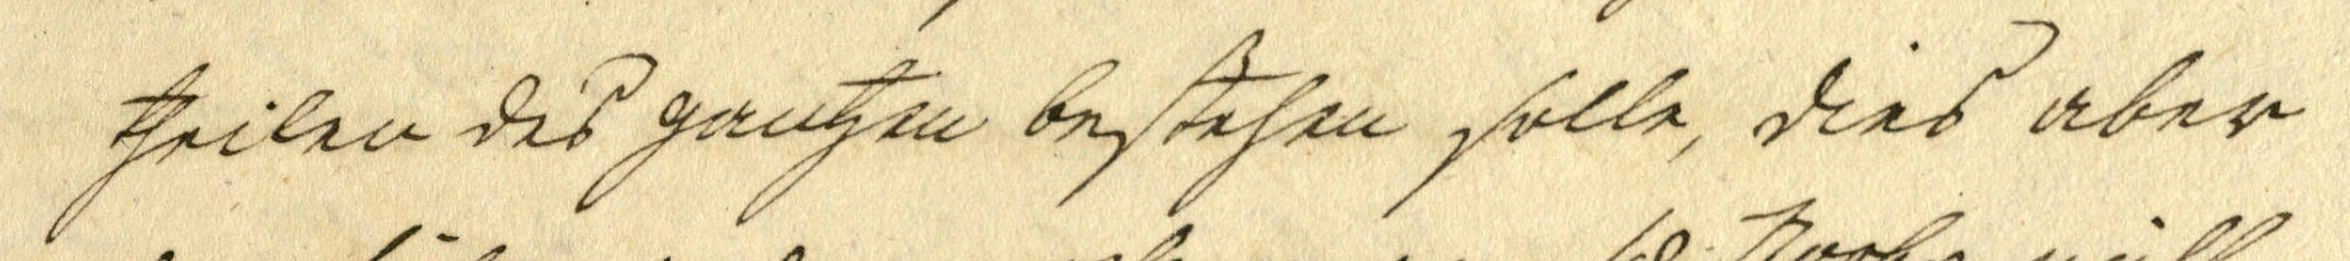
theilen des gantzen bestehen solle, dies aber
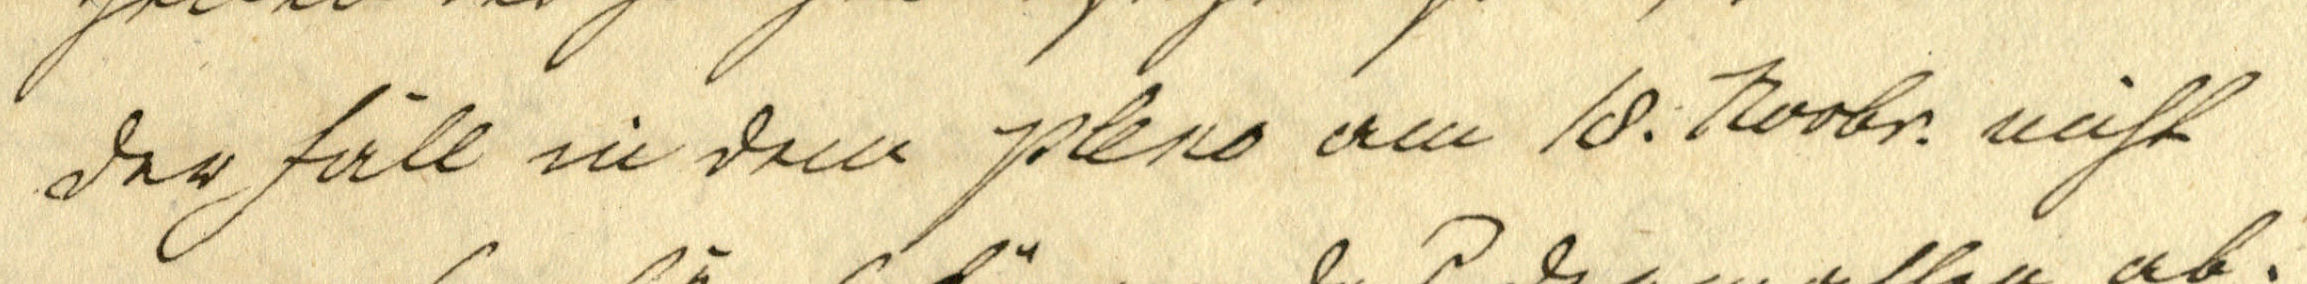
der Fall in dem pleno am 18. Novbr. nicht
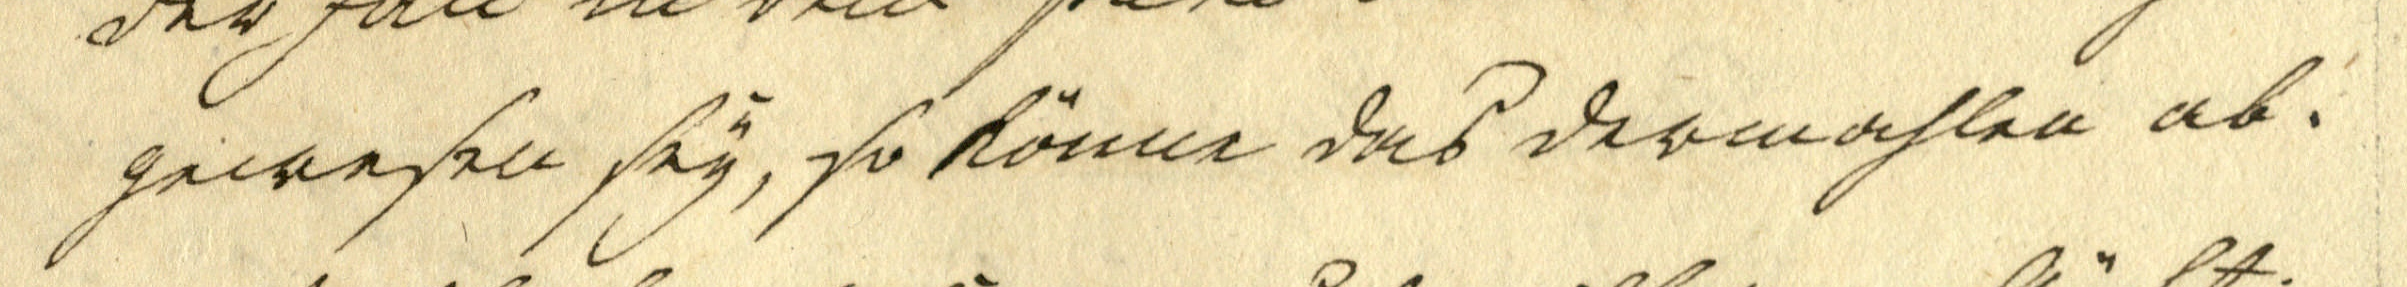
gewesen seÿ, so könne das dermahlen ab¬
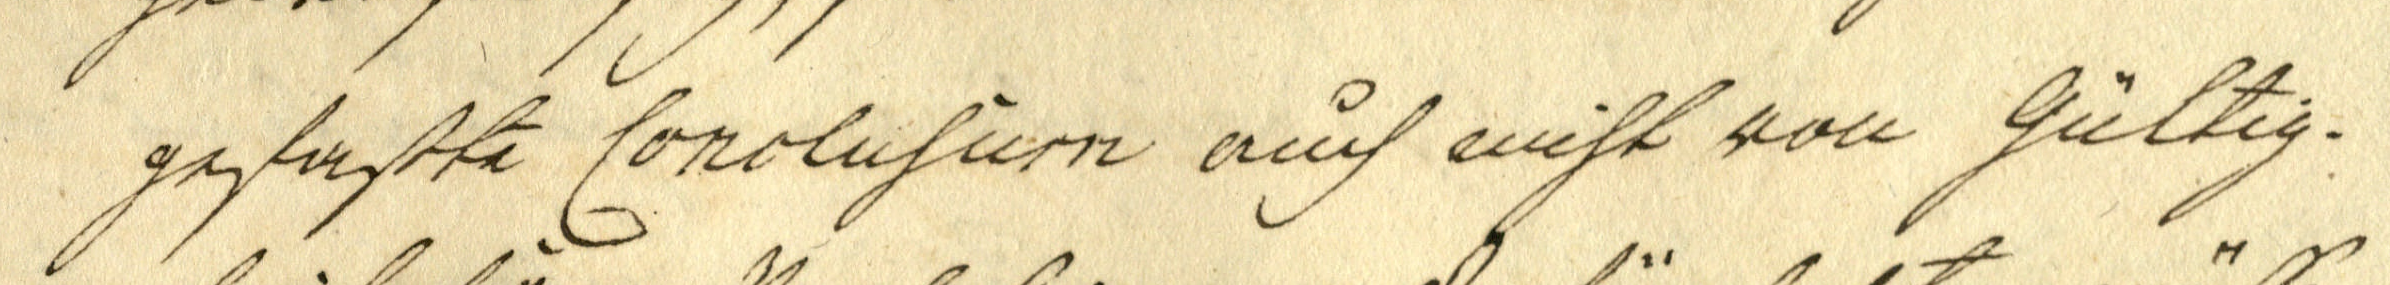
gefaßte Conclusum auch nicht von Gültig¬
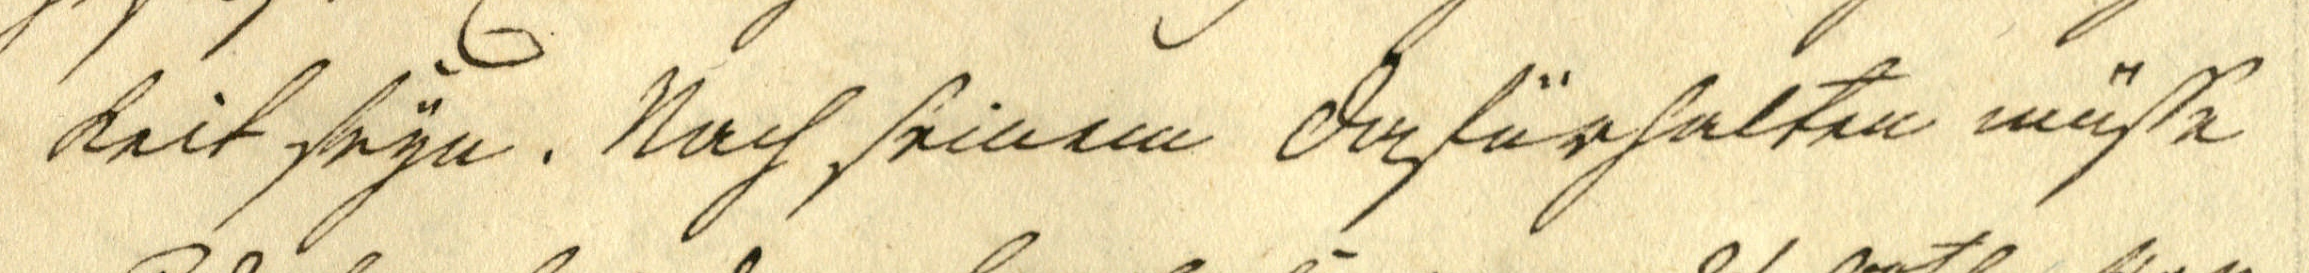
keit seÿn. Nach seinem Dafürhalten müsse
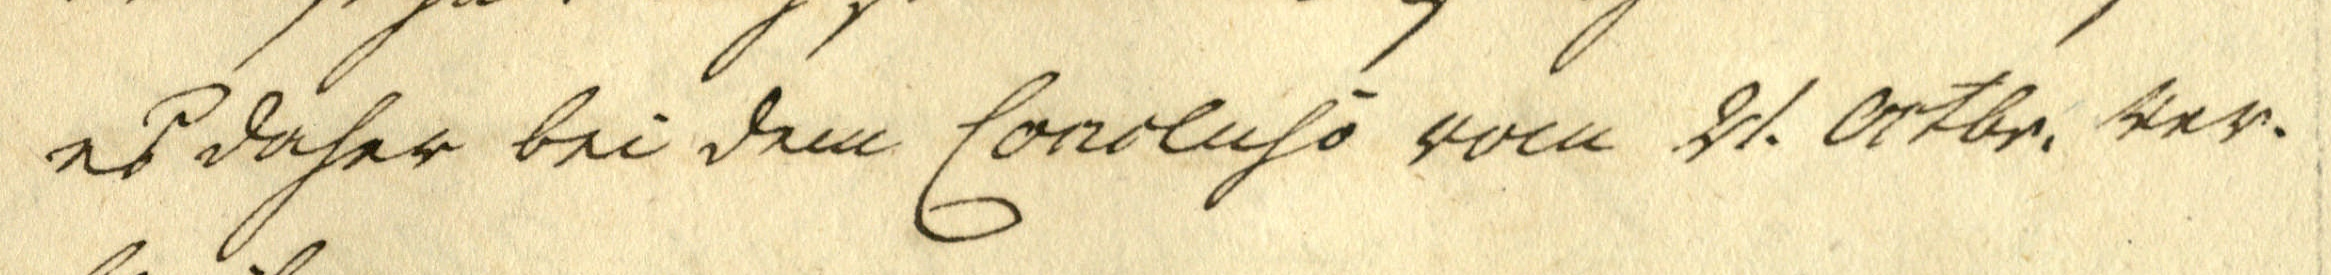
es daher bei dem Concluso vom 21. Octbr. ver¬
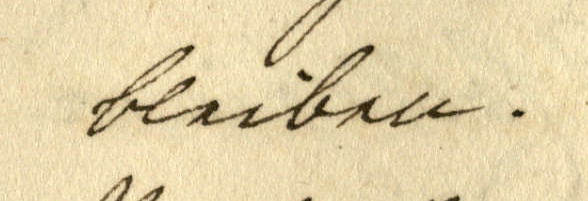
bleiben.
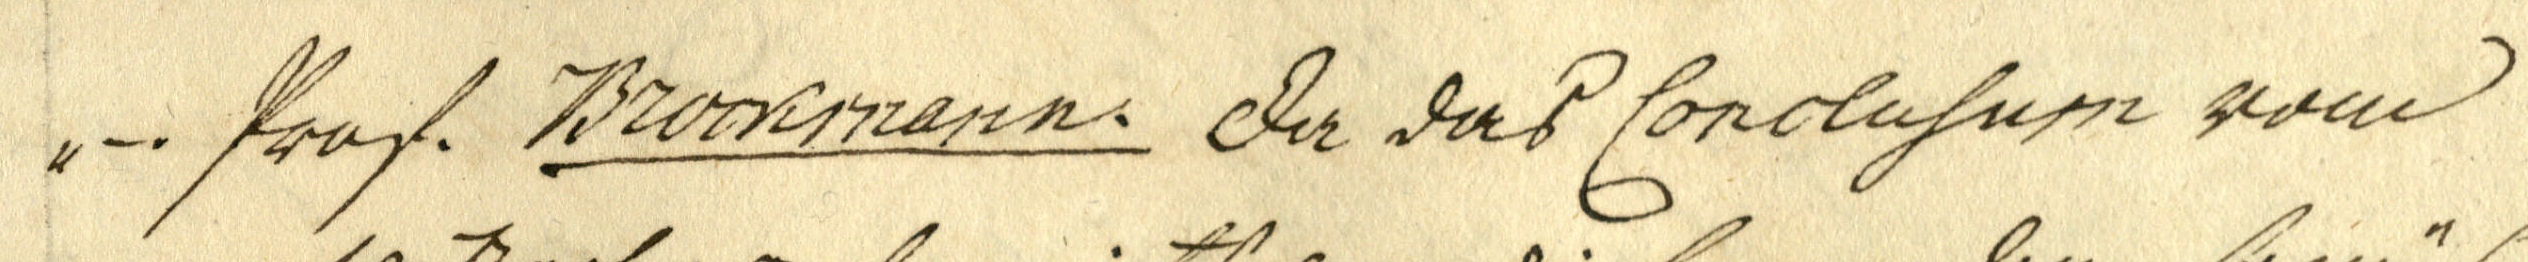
Prof. Brockmann. Da das Conclusum vom
